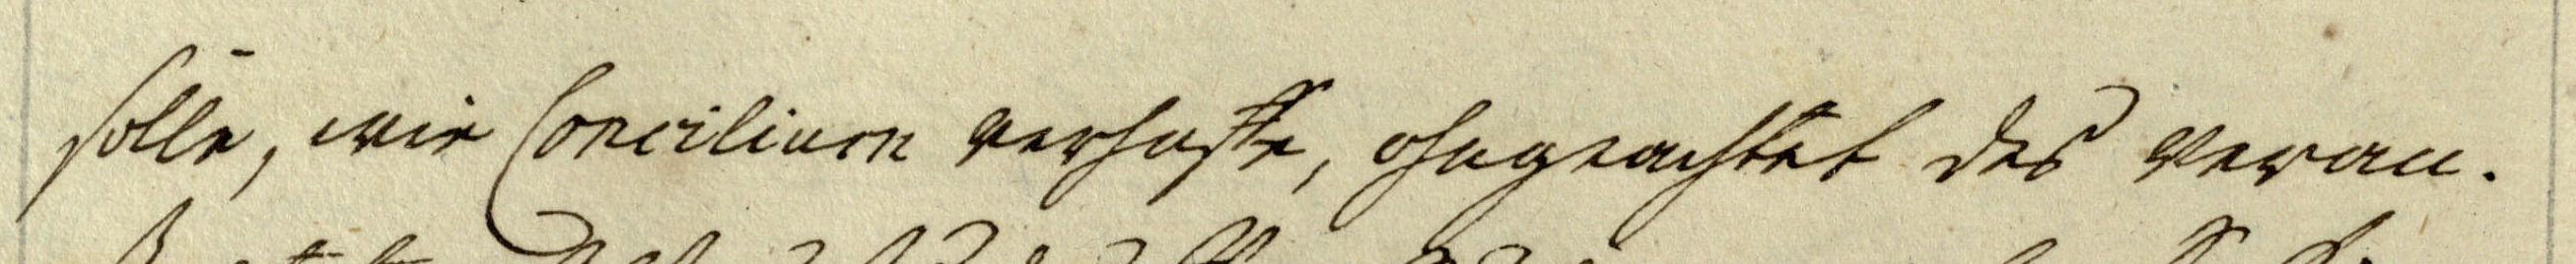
solle, wie Concilium verhoffe, ohngeachtet des veran¬
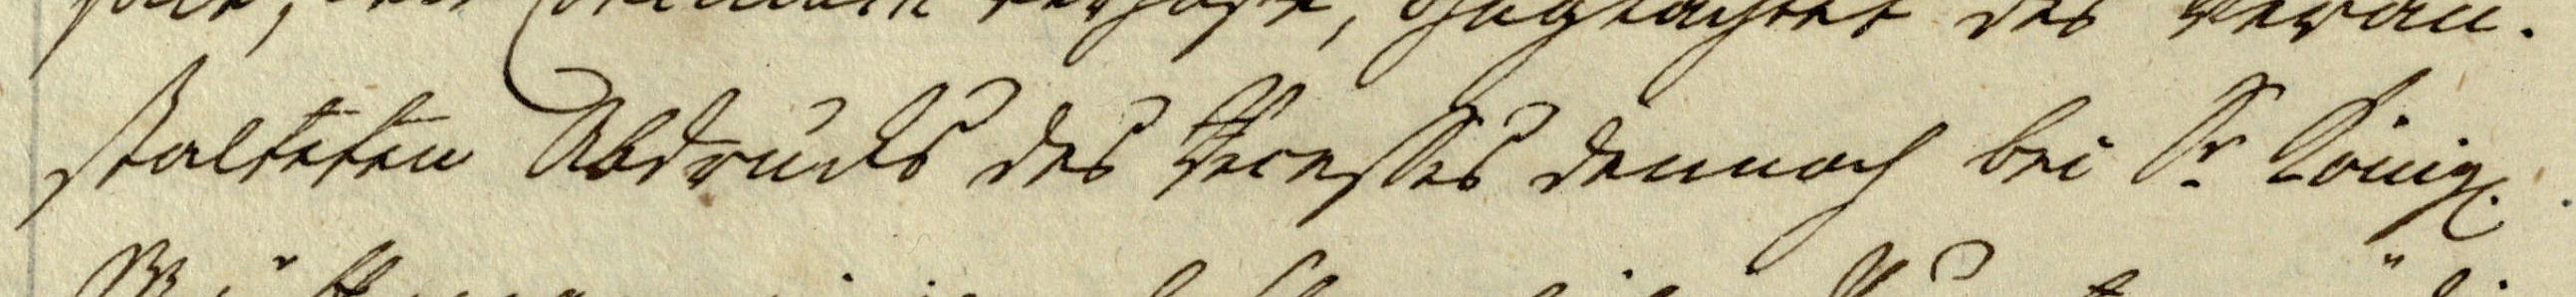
stalteten Abdrucks des Recesses dennoch bei Sr. Königl.
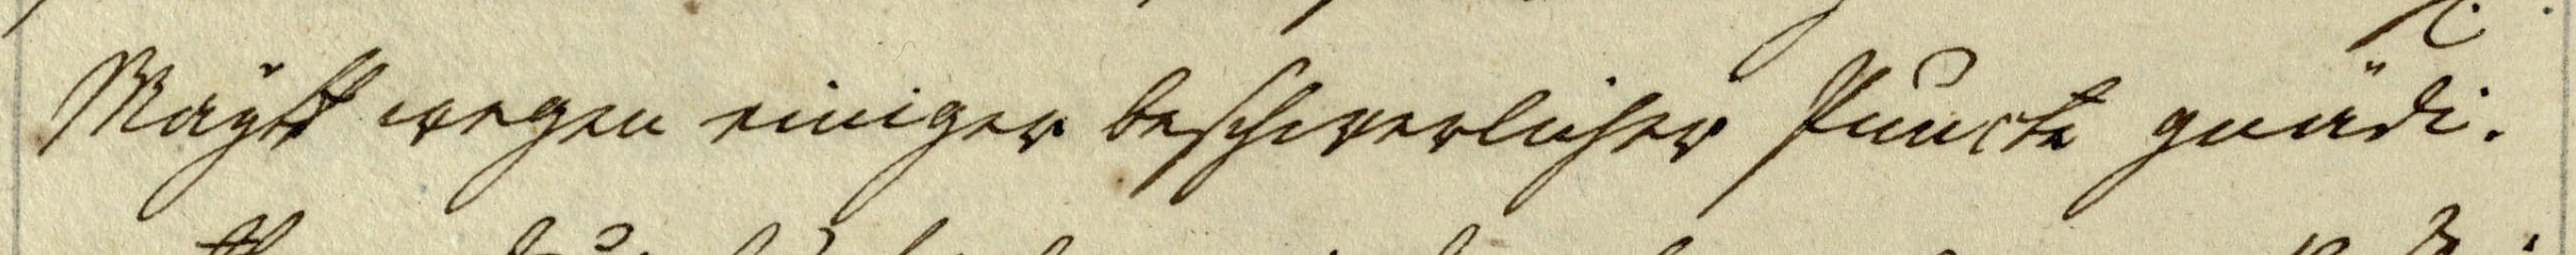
Maÿtt. wegen einiger beschwerlicher Puncte gnädi¬
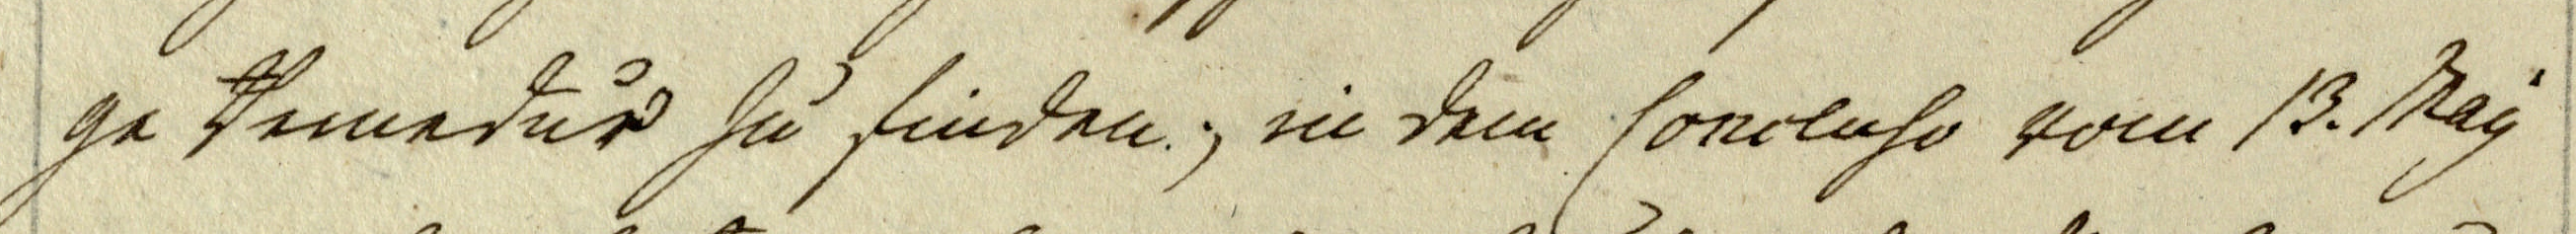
ge Remedur zu finden; in dem Concluso vom 13. Maÿ
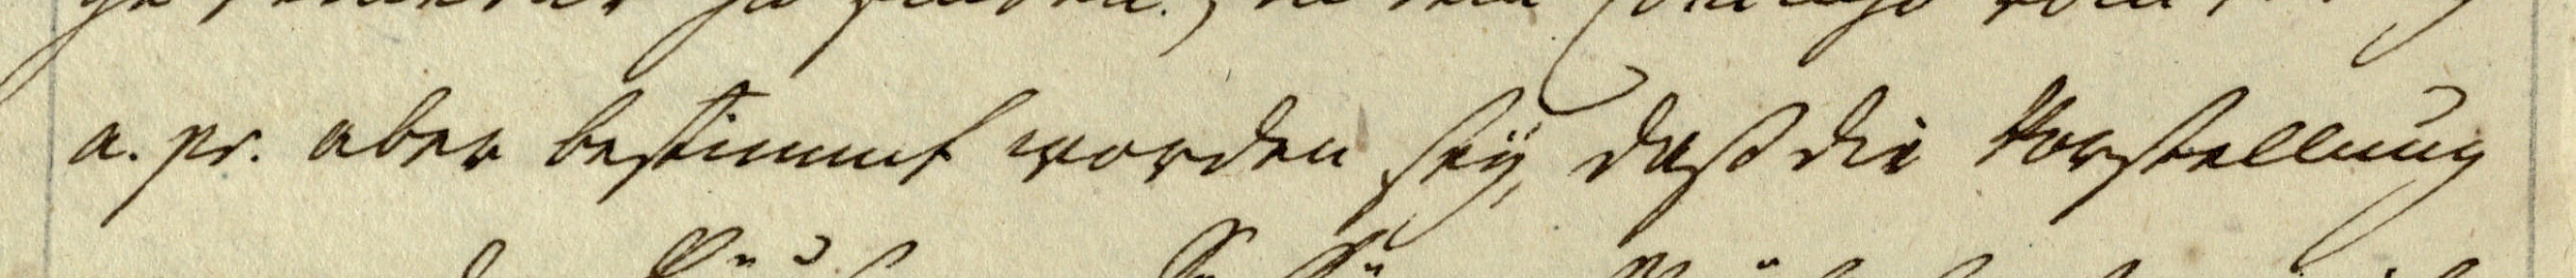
a. pr. aber bestimmt worden seÿ, daß die Vorstellung
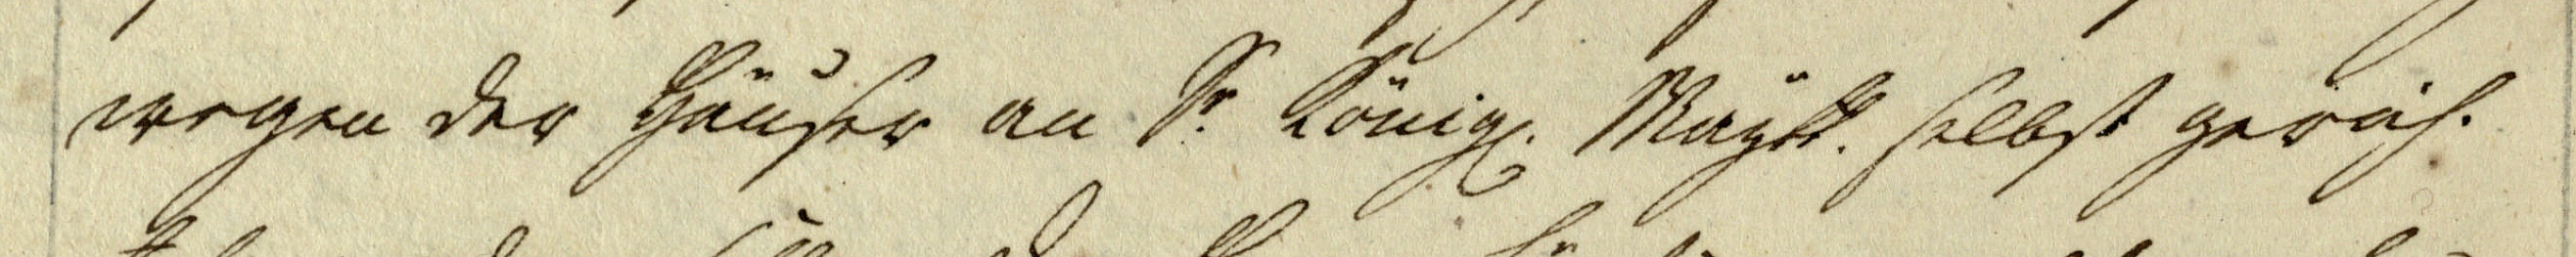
wegen der Häuser an Sr. Königl. Maÿtt. selbst gerich¬
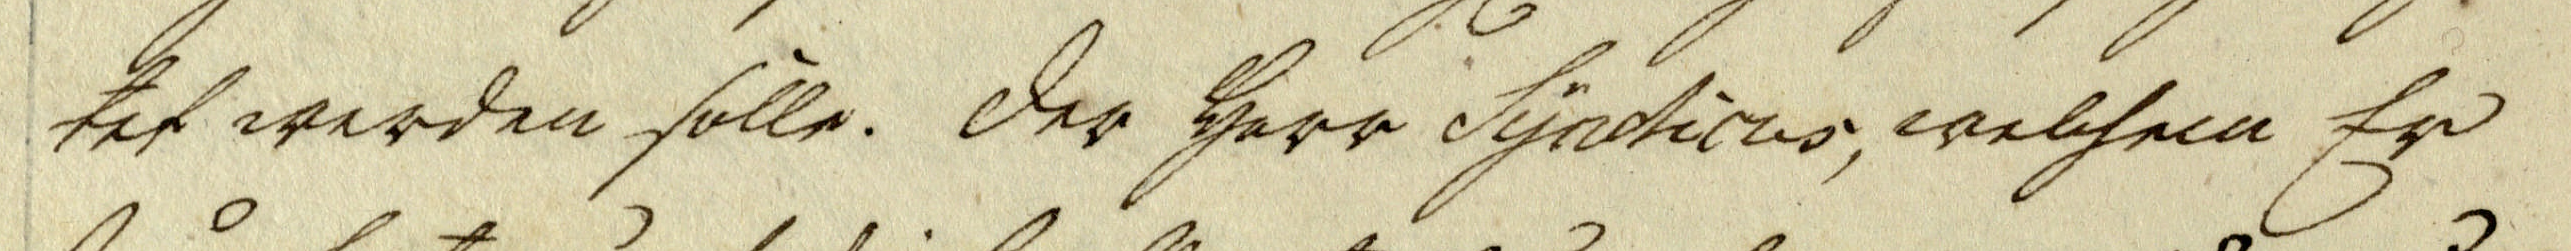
tet werden solle. Der Herr Sÿndicus, welchem Er
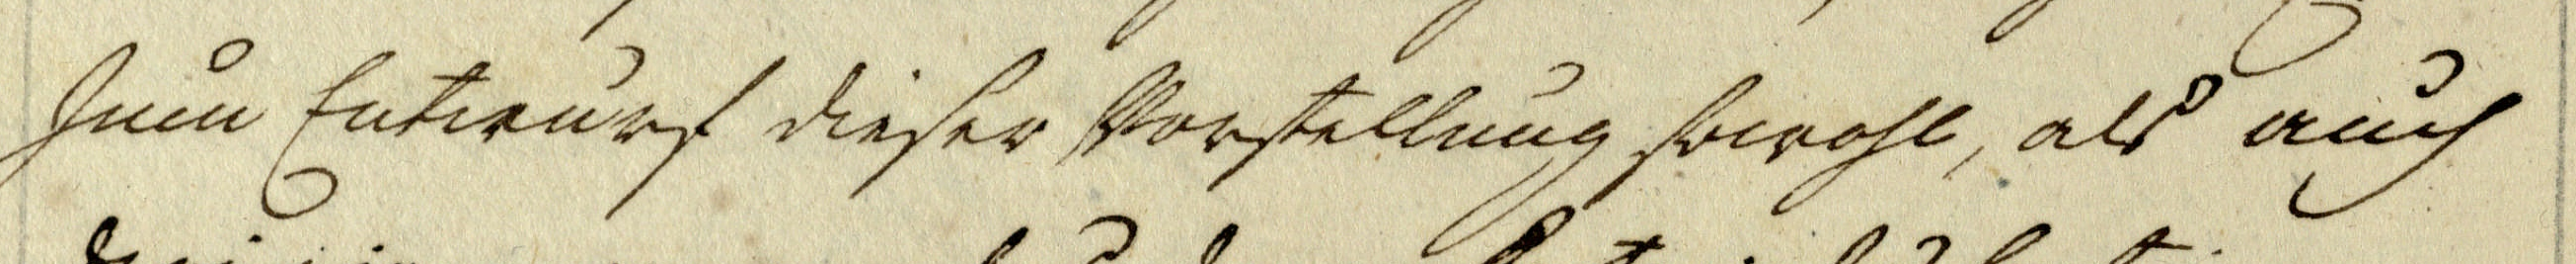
zum Entwurf dieser Vorstellung sowohl, als auch
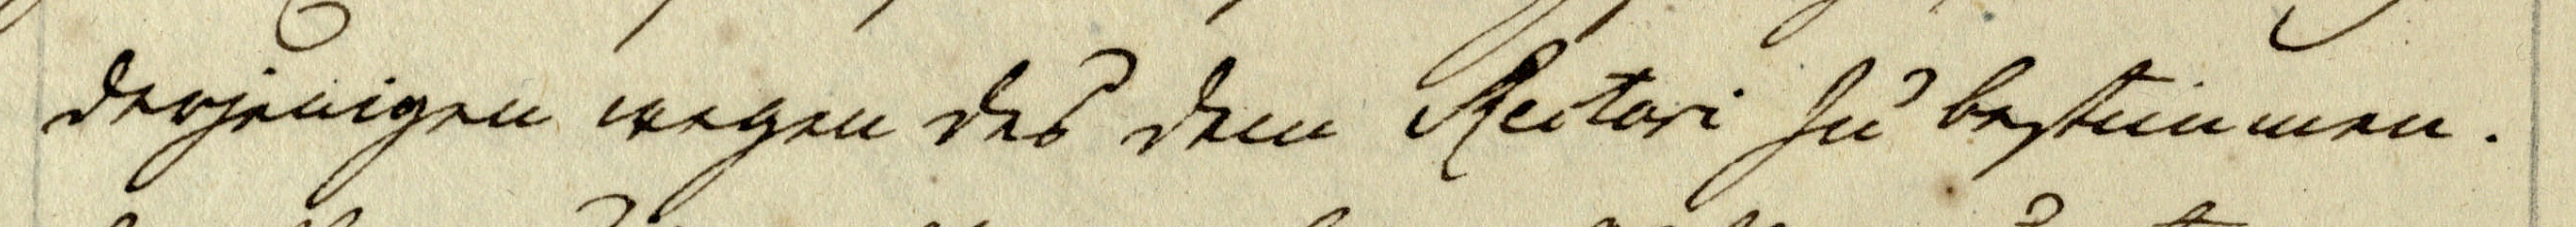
derjenigen wegen des dem Rectori zu bestimmen¬
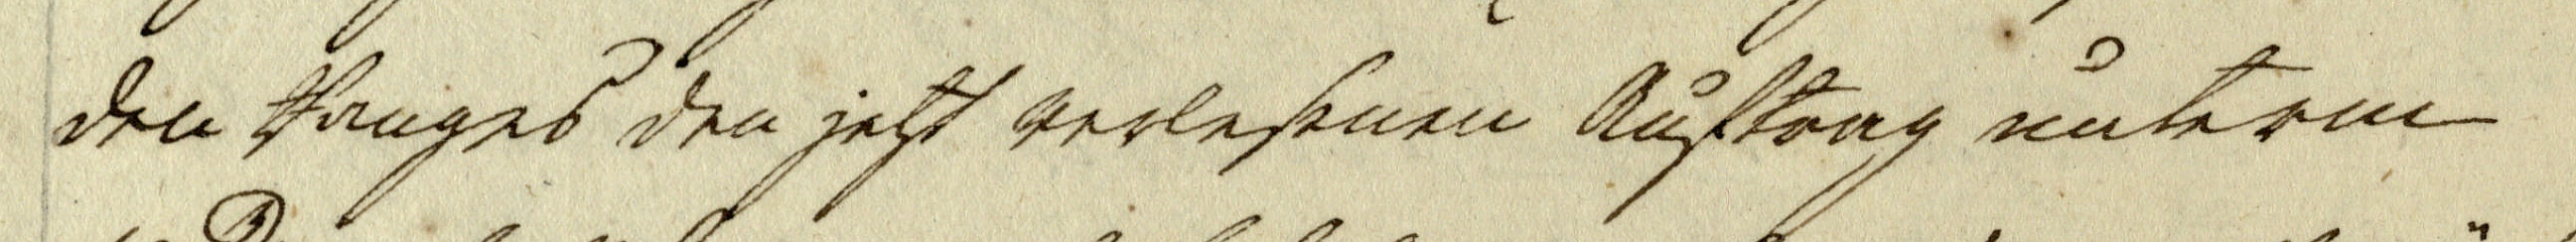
den Ranges den jetzt verlesenen Auftrag unterm
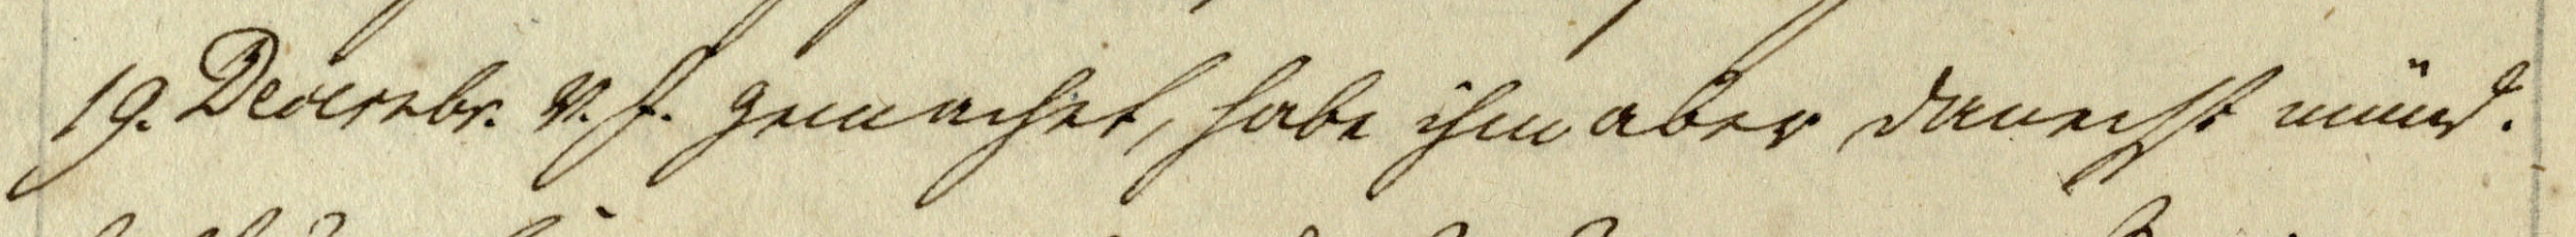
19. Decembr. v. J. gemachet, habe ihm aber danechst münd¬
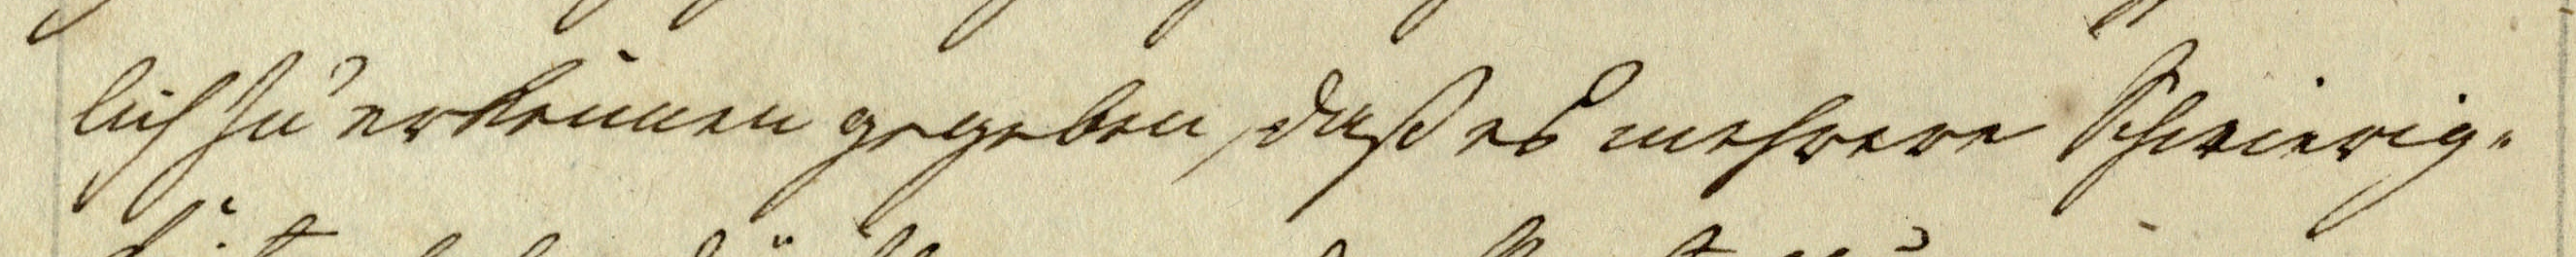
lich zu erkennen gegeben, daß es mehrere Schwierig¬
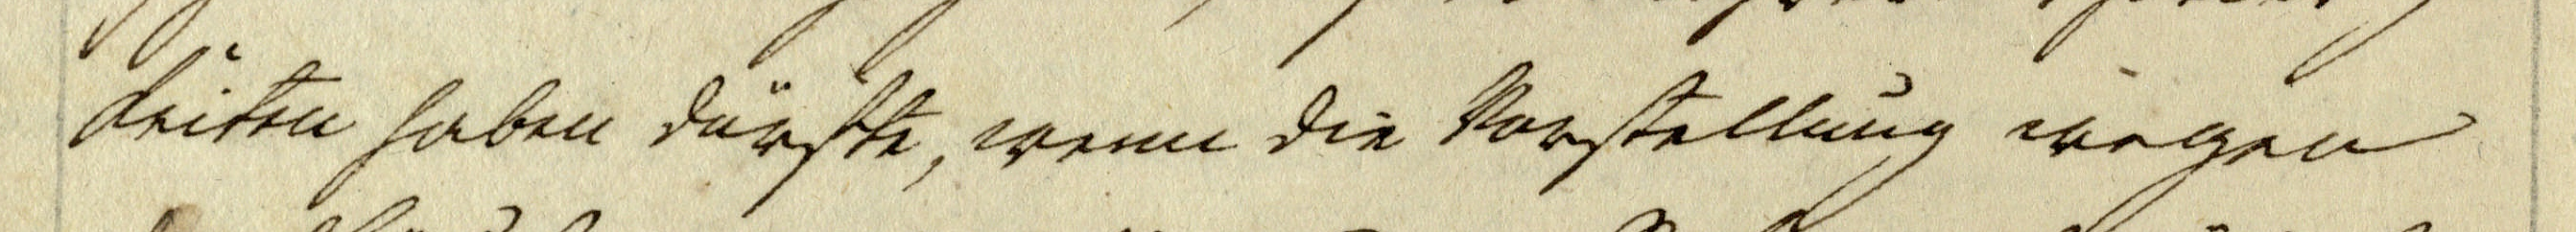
keiten haben dürfte, wenn die Vorstellung wegen
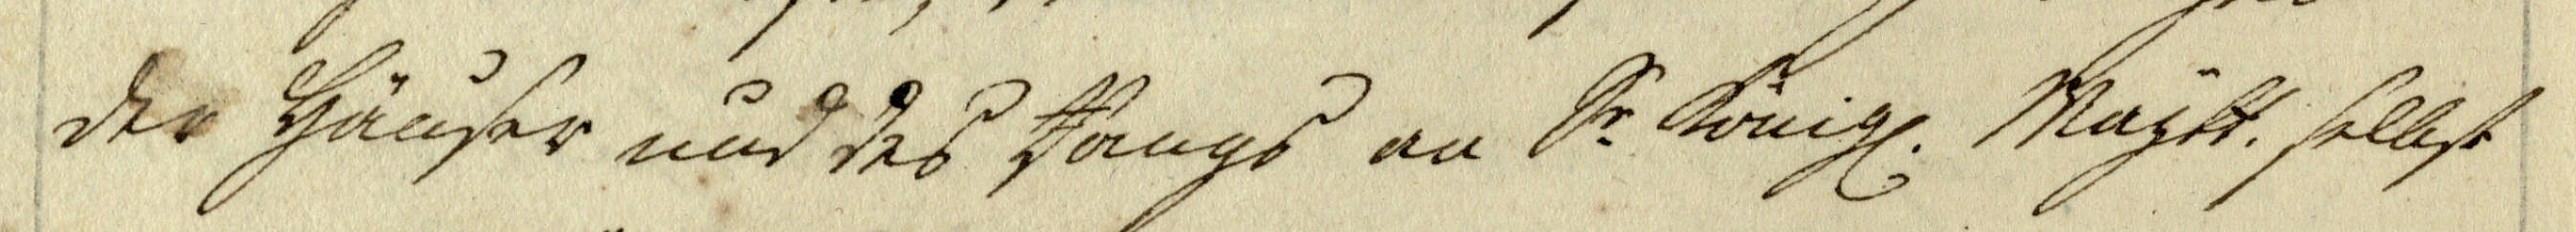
der Häuser und des Rangs an Sr Königl. Maÿtt. selbst
